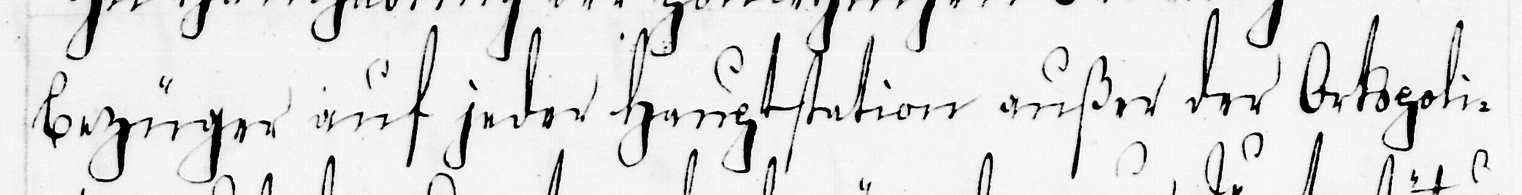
Bezüger auf jeder Hauptstation außer der Ortspoli¬
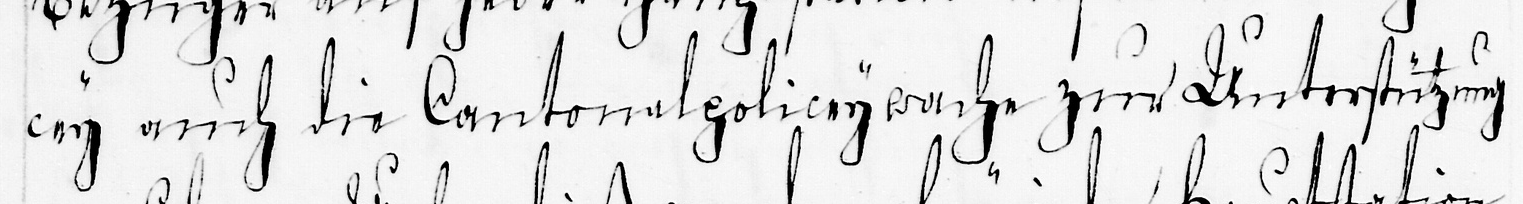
cey auch die Cantonalpoliceywache zur Unterstützung
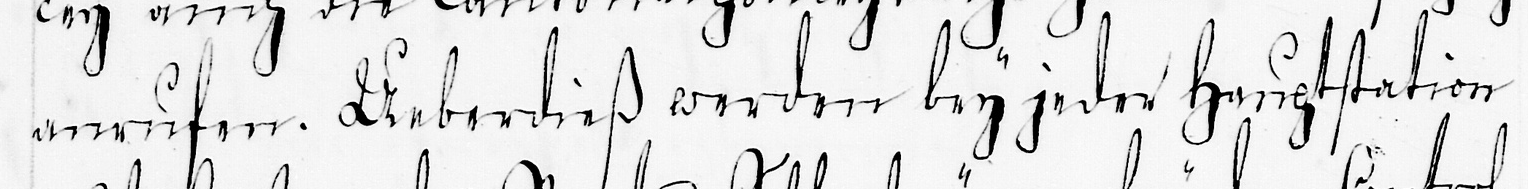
anrufen. Ueberdieß werden bey jeder Hauptstation
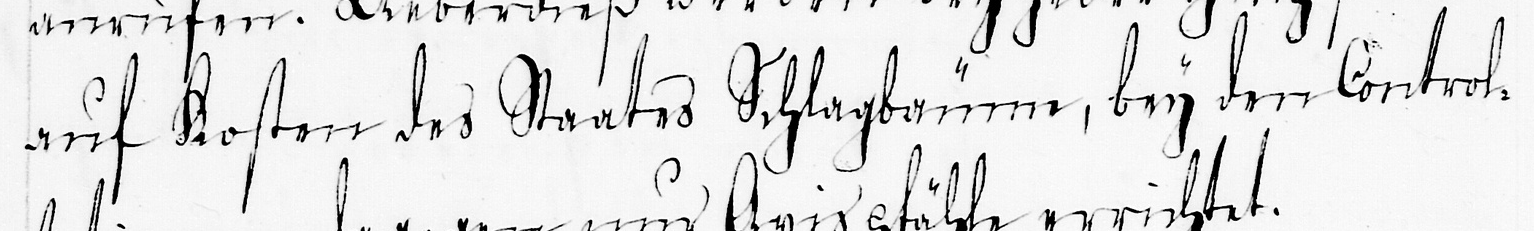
auf Kosten des Staates Schlagbäume, bey den Control¬
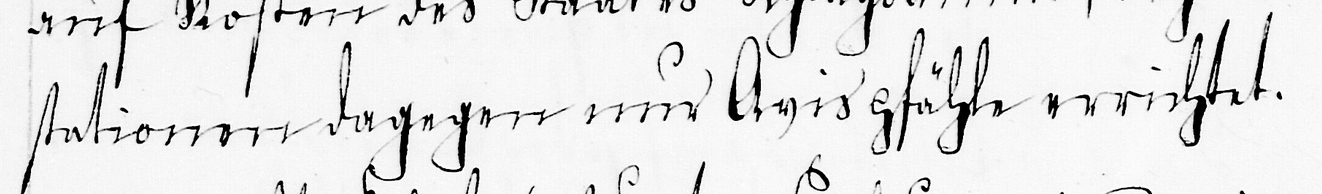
stationen dagegen nur Avispfähle errichtet.
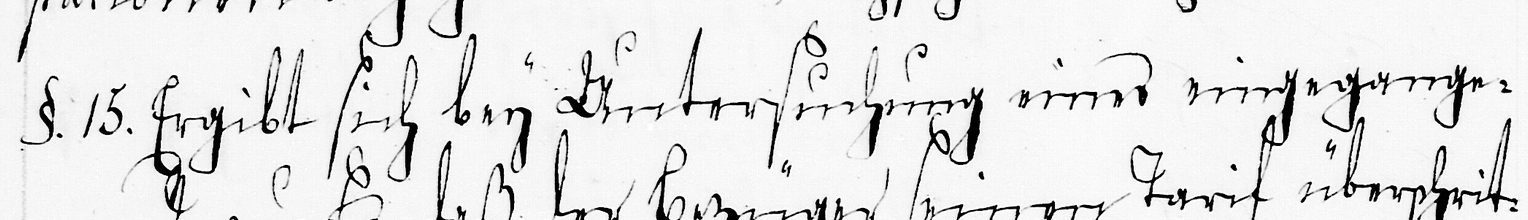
15. Ergibt sich bey Untersuchung eines eingegange¬
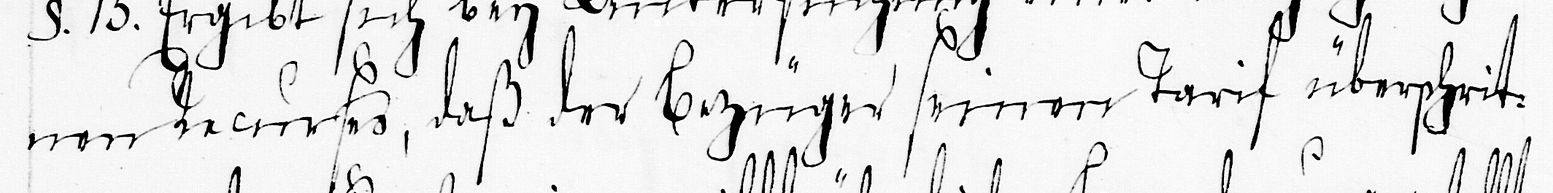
nen Recurses, daß der Bezüger seinen Tarif überschrit¬
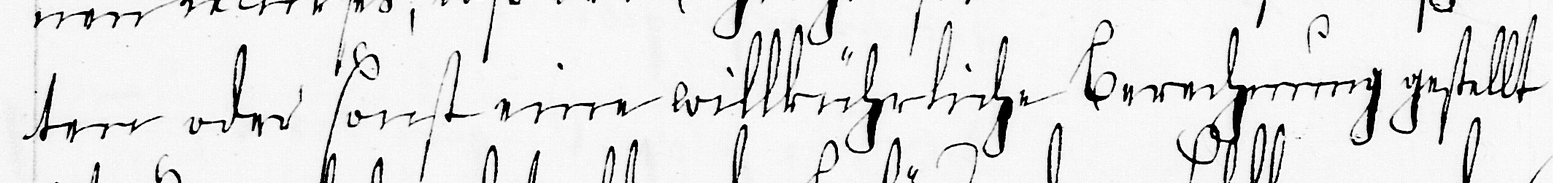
ten oder sonst eine willkührliche Berechnung gestellt
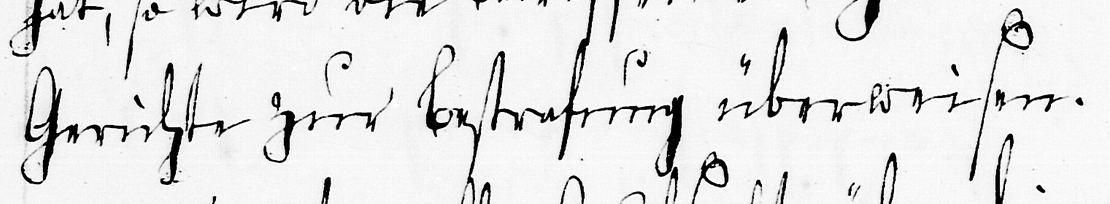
Gerichte zur Bestrafung überweisen.
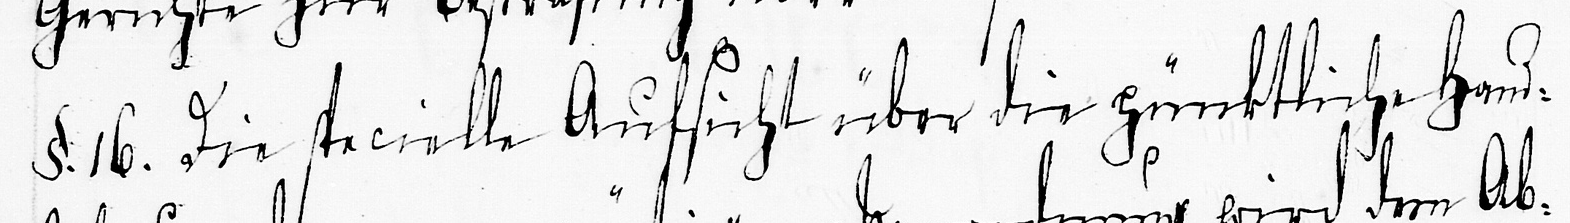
§. 16. Die specielle Aufsicht über die pünktliche Hand¬
